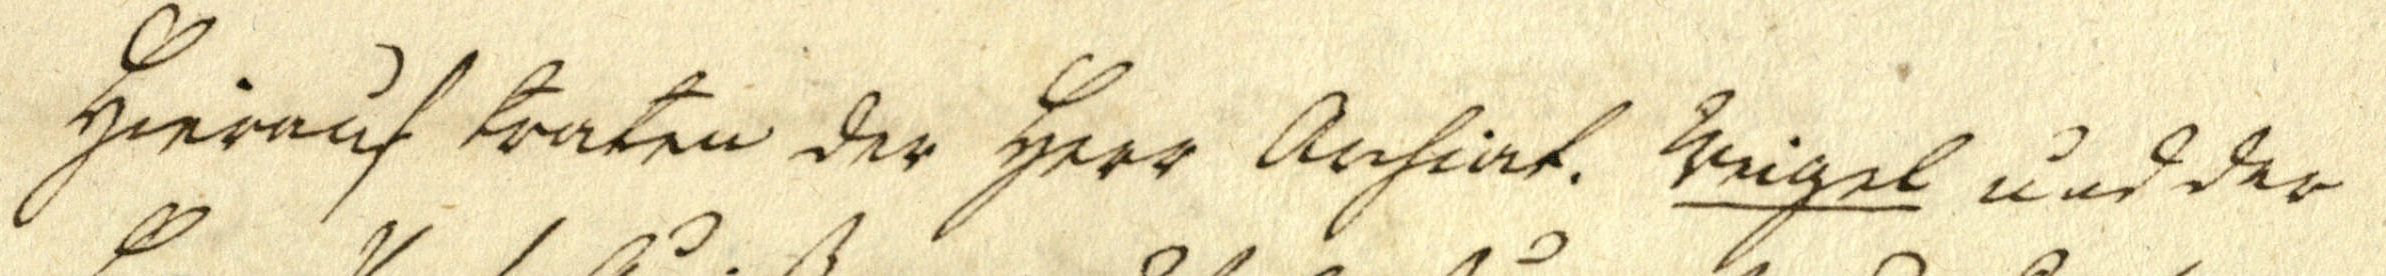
Hierauf traten der Herr Archiat. Weigel und der
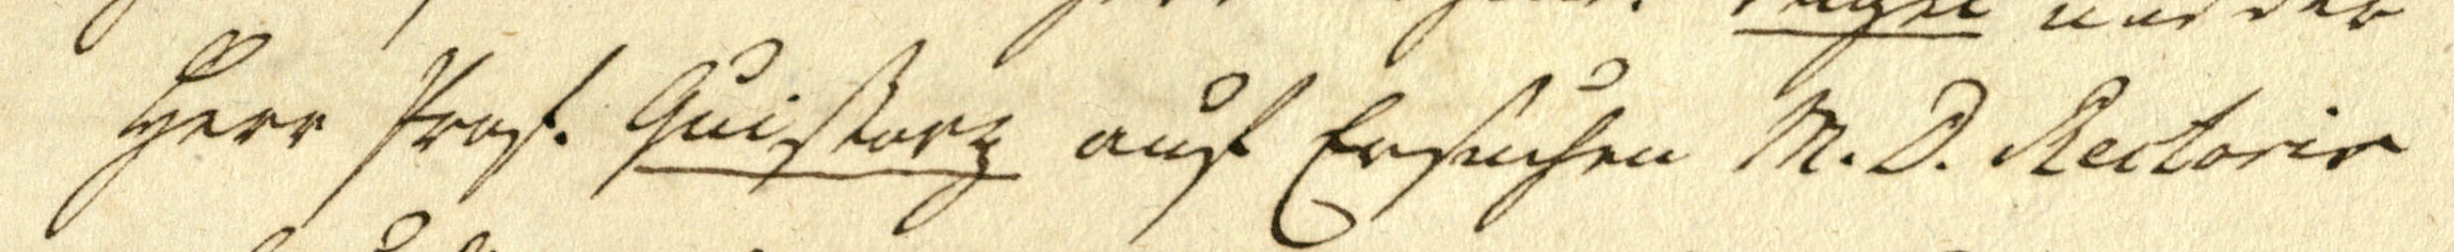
Herr Prof. Quistorp auf Ersuchen M. D. Rectoris
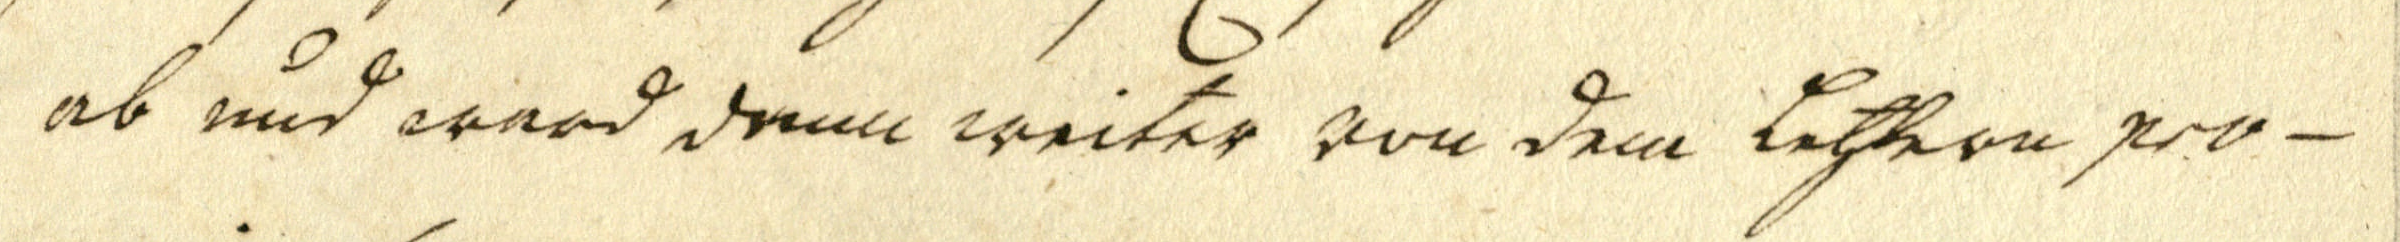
ab und ward dann weiter von dem Letztern pro¬
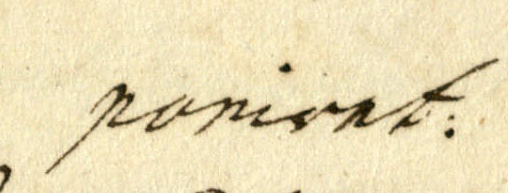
poniret.
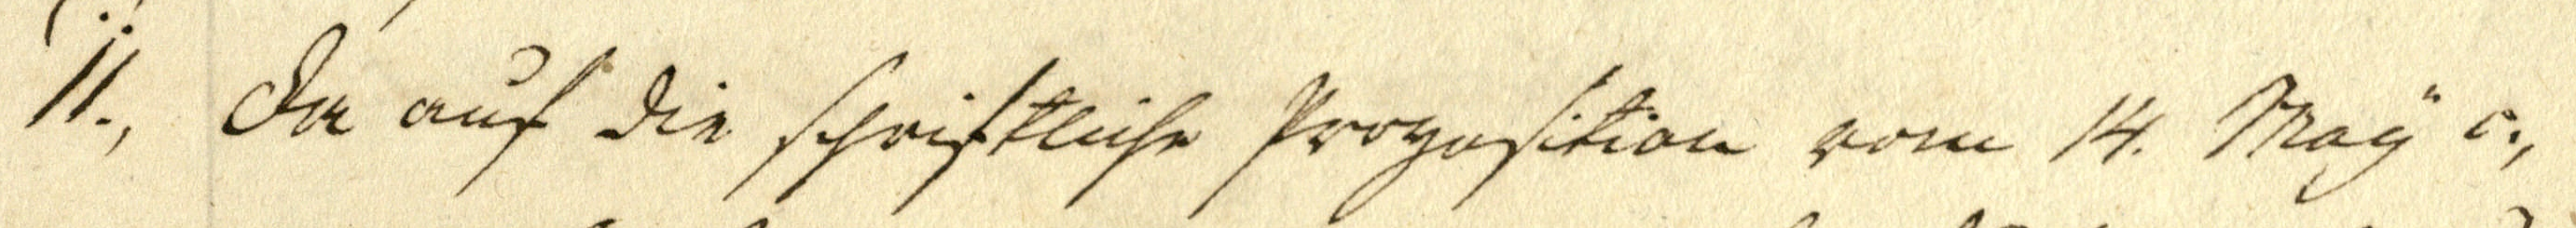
11., Da auf die schriftliche Proposition vom 14. Maÿ c.,
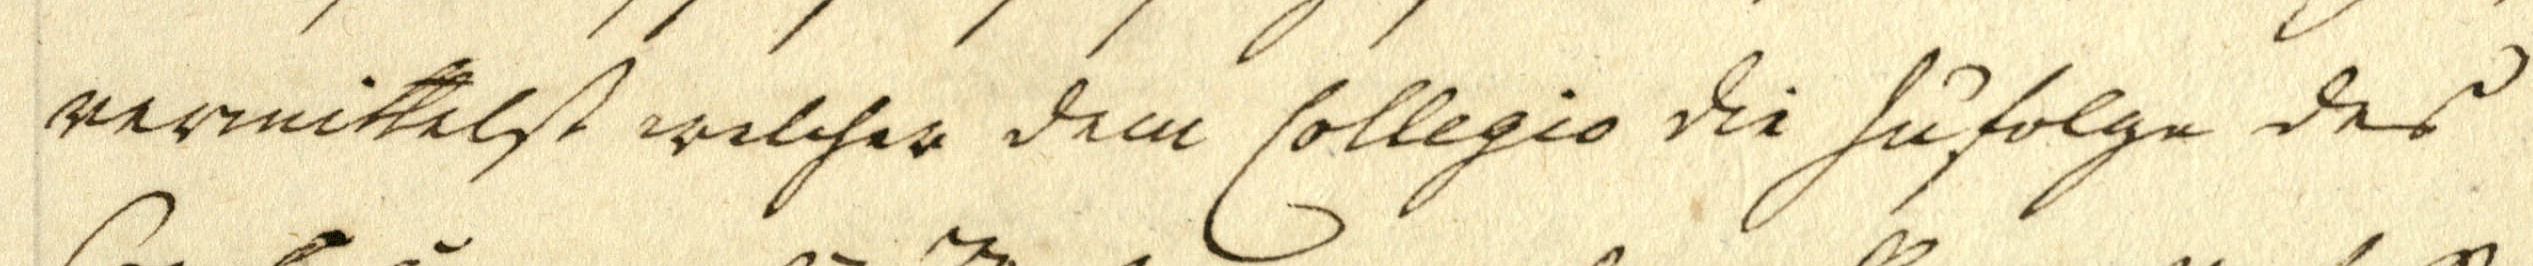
vermittelst welcher dem Collegio die zufolge des
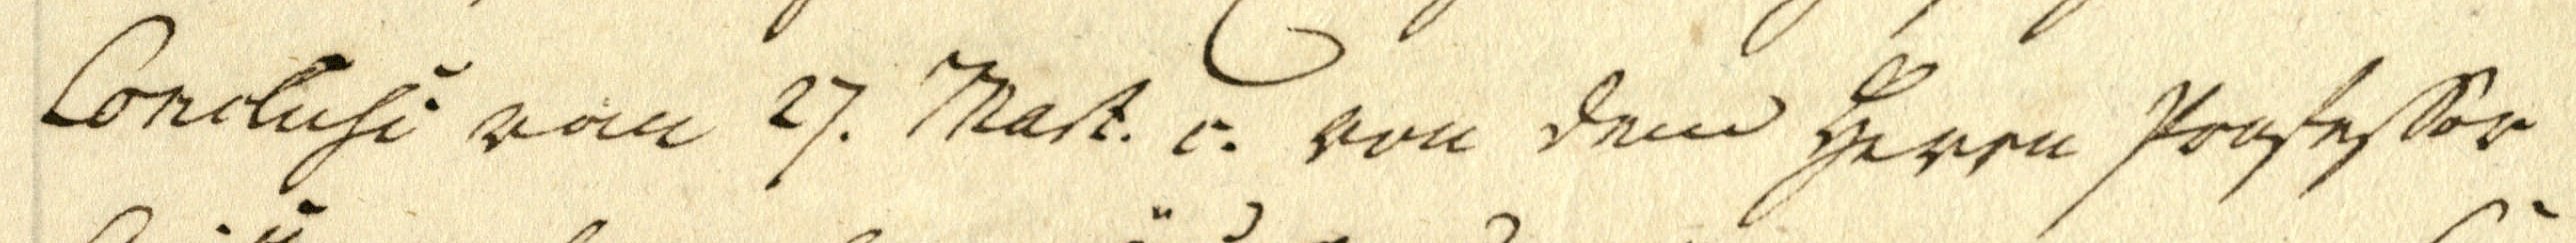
Conclusi vom 27. Mart. c. von dem Herrn Professor
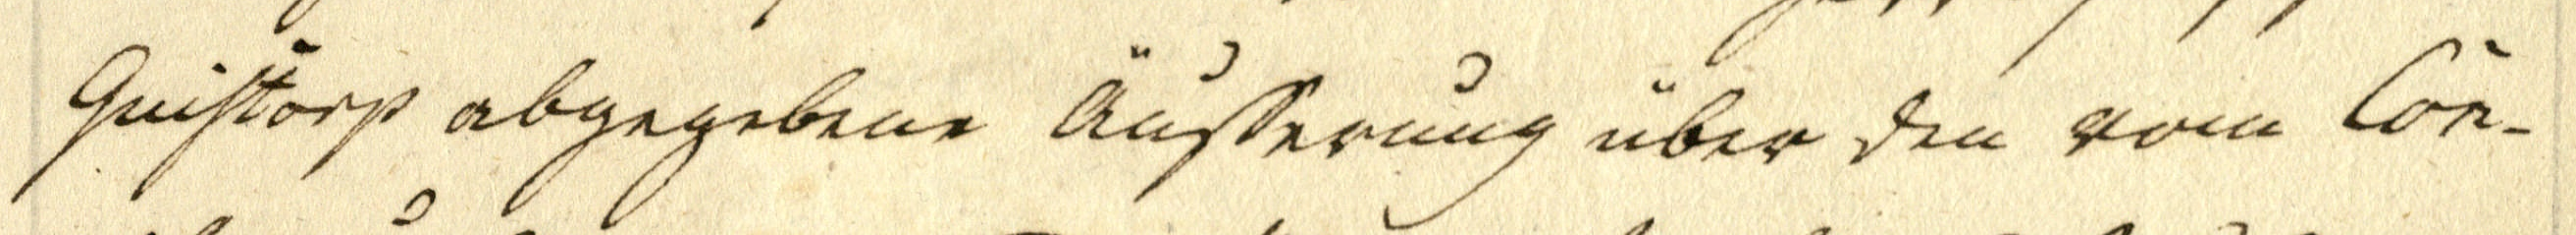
Quistorp abgegebene Äusserung über den vom Con¬
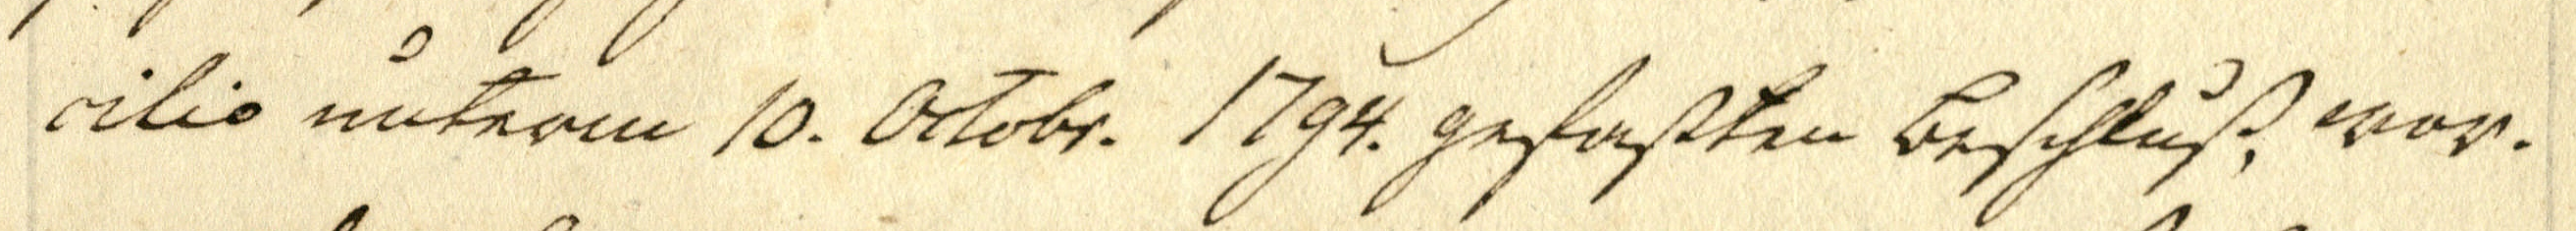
cilio unterm 10. Octobr. 1794. gefaßten Beschluß, wor¬
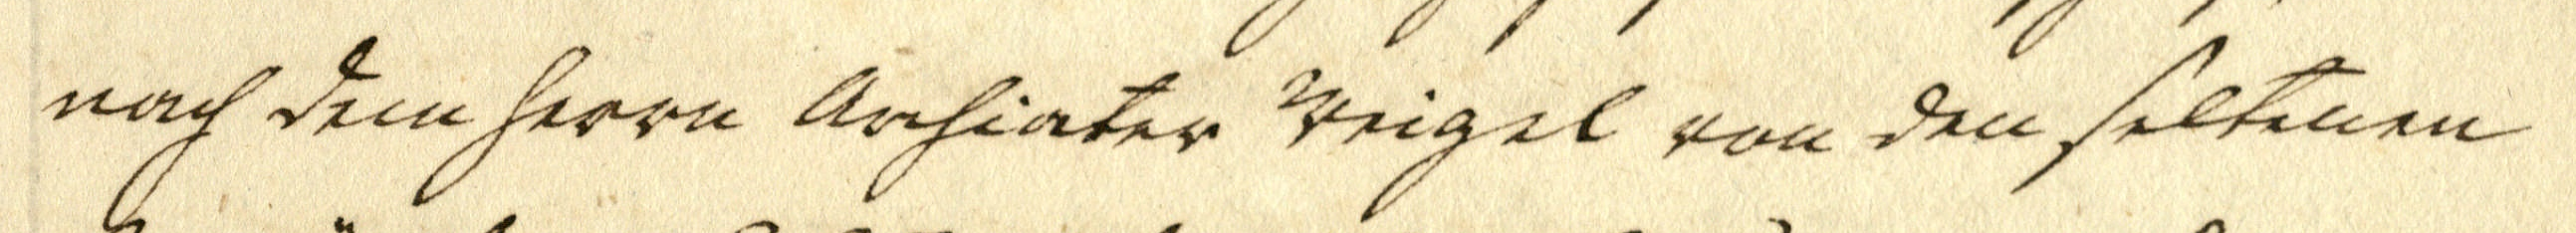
nach dem herrn Archiater Weigel von den seltenen
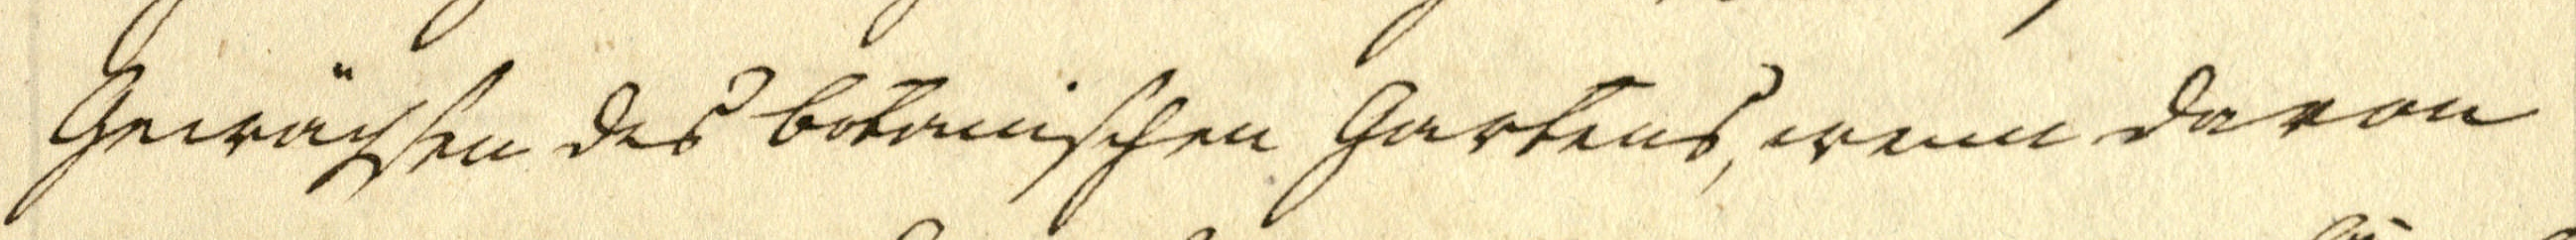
Gewächsen des botanischen Gartens, wenn davon
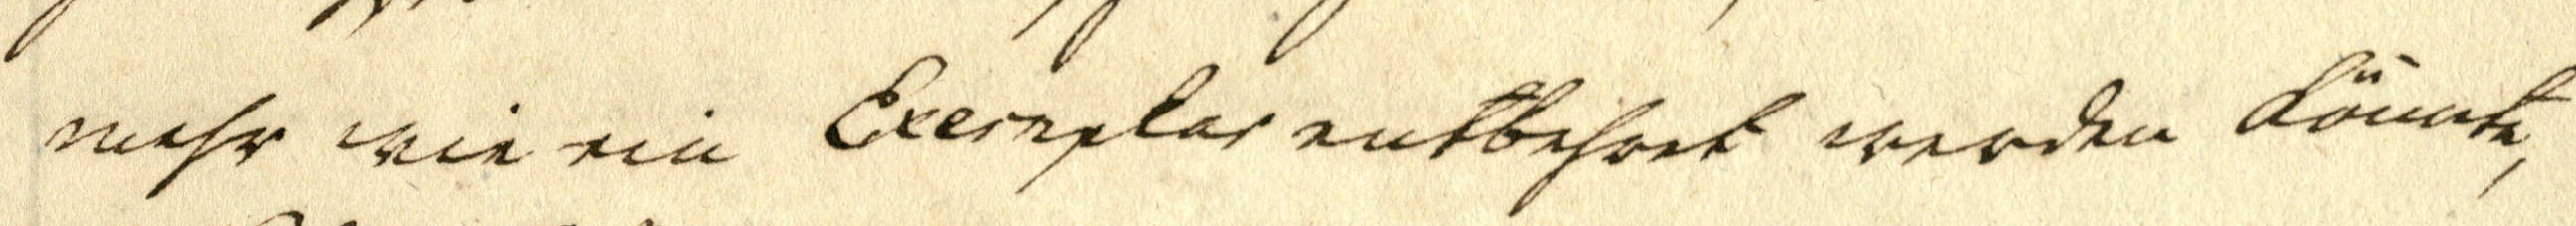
mehr wie ein Exemplar entbehret werden könnte,
